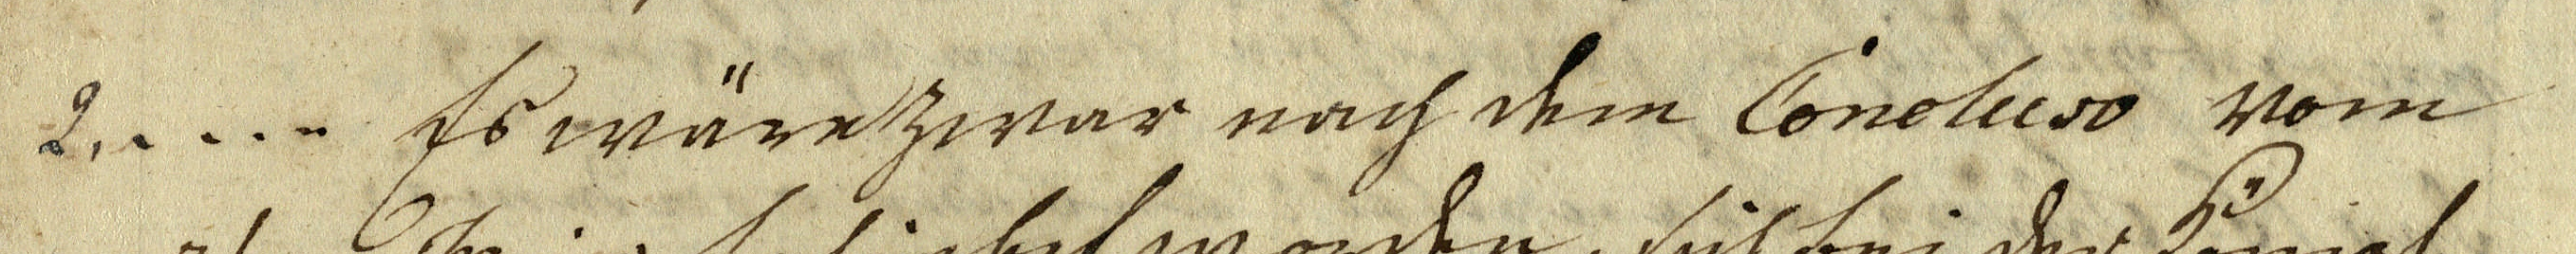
2. Es wäre zwar nach dem Concluso vom
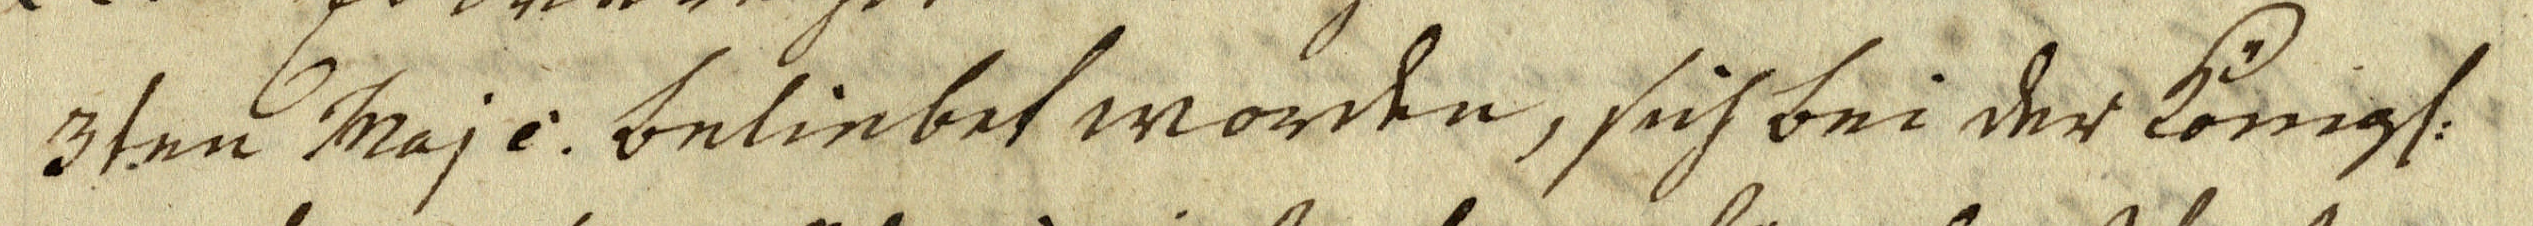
3 ten Maj e. beliebet worden, sich bei der Königl:
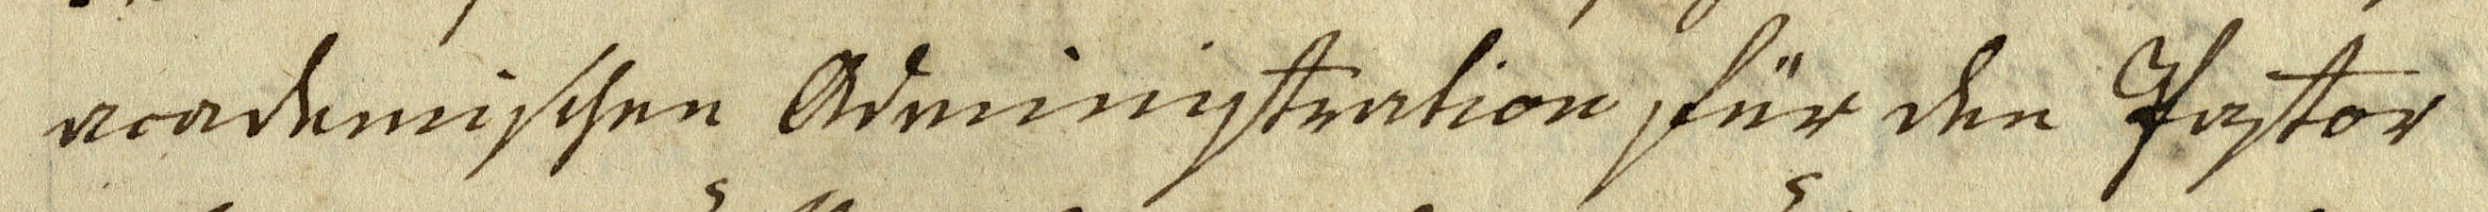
academischen Administration für den Pastor
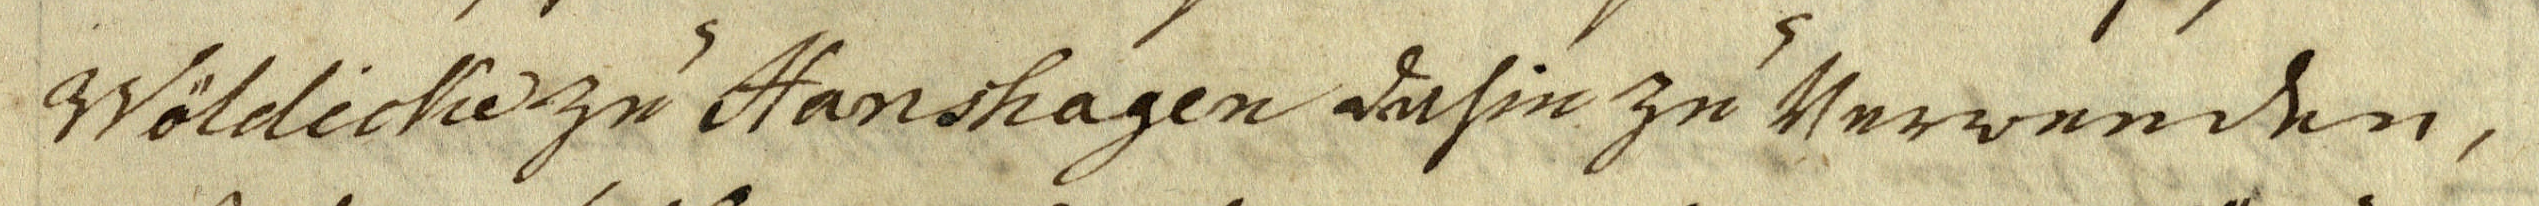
Wöldicke zu Hanshagen dahin zu verwenden,
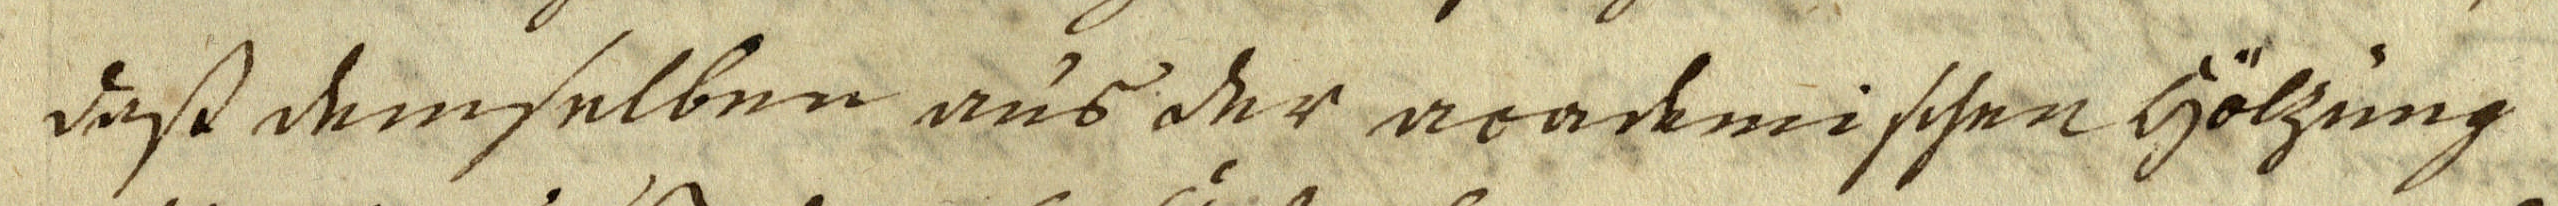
daß demselben aus der academischen Hölzung
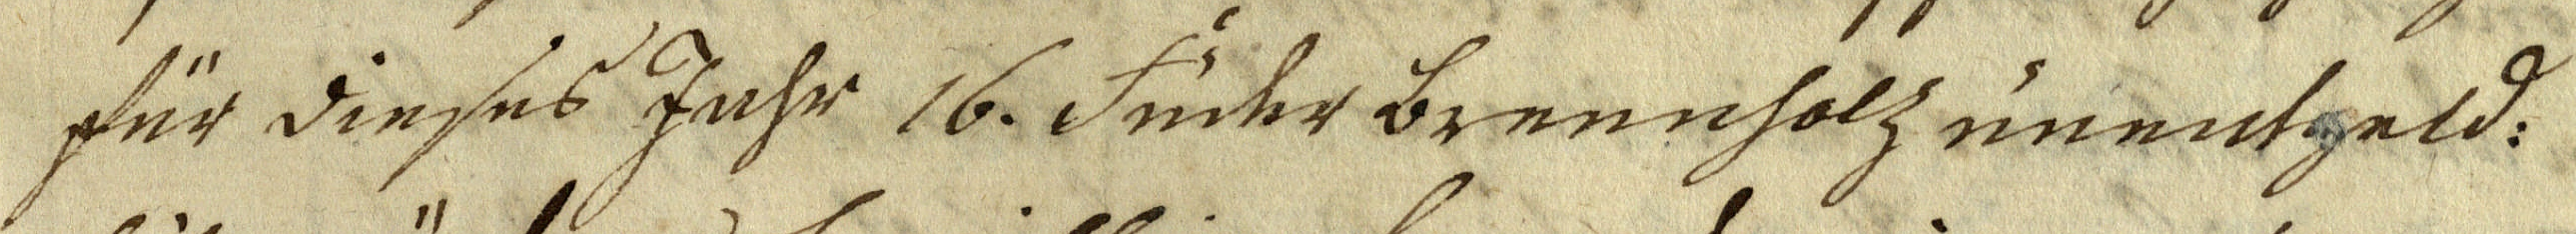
für dieses Jahr 16. Fuder Brennholz unentgeld¬
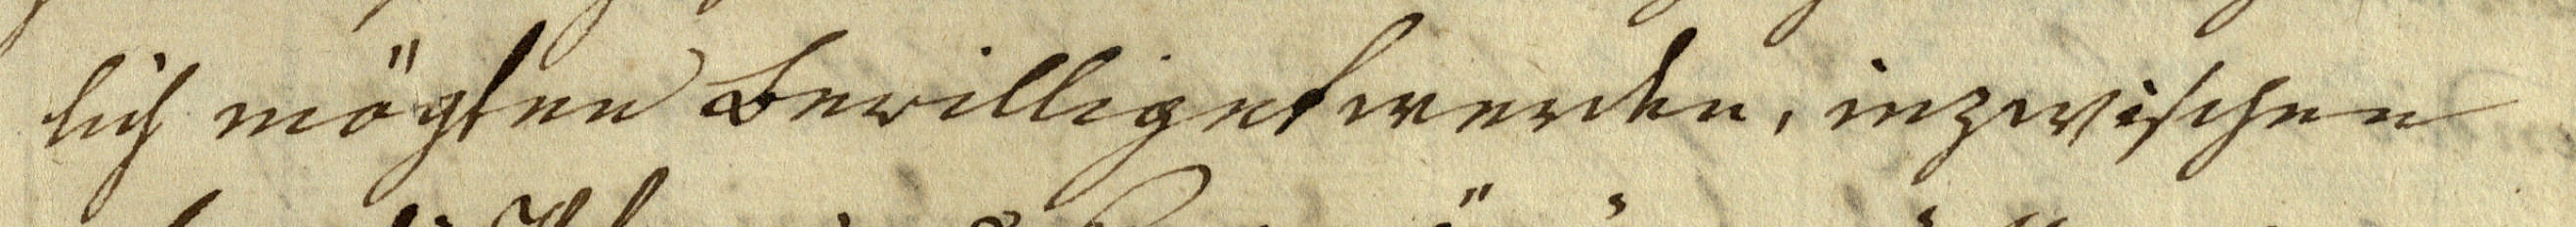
lich mögten bewilliget werden, inzwischen
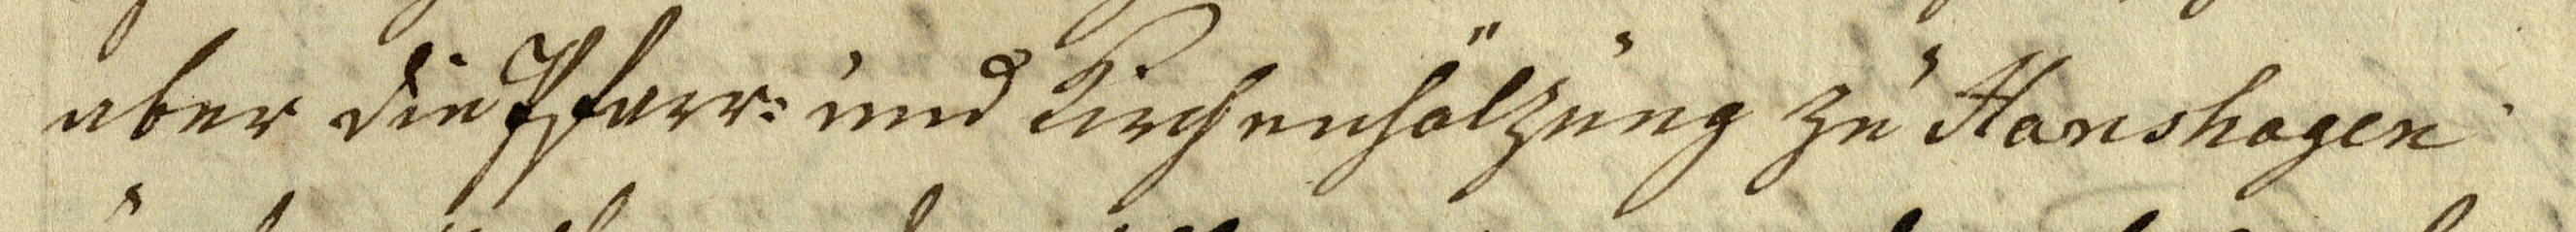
aber die Pfarr- und Kirchenhölzung zu Hanshagen
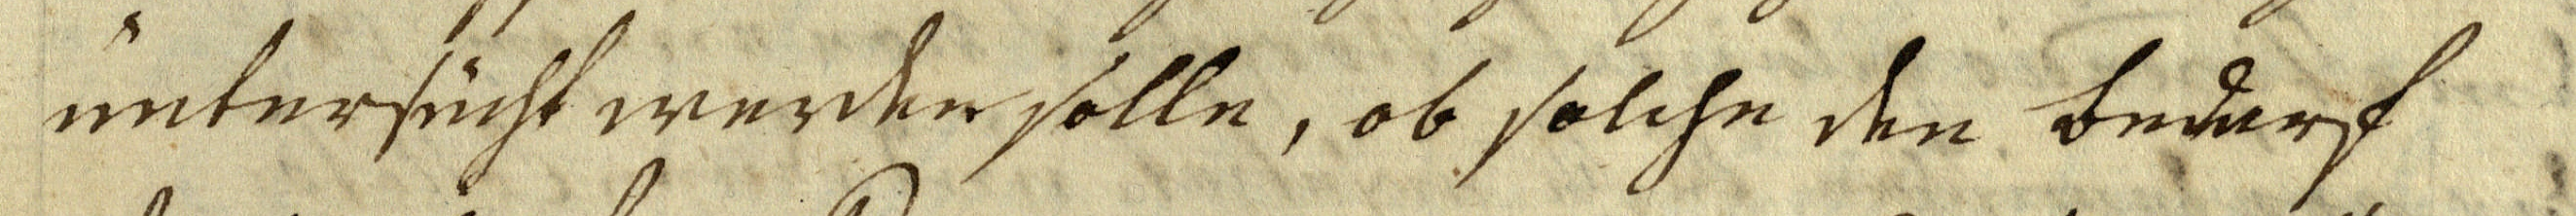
untersucht werden solle, ob solche den Bedarf
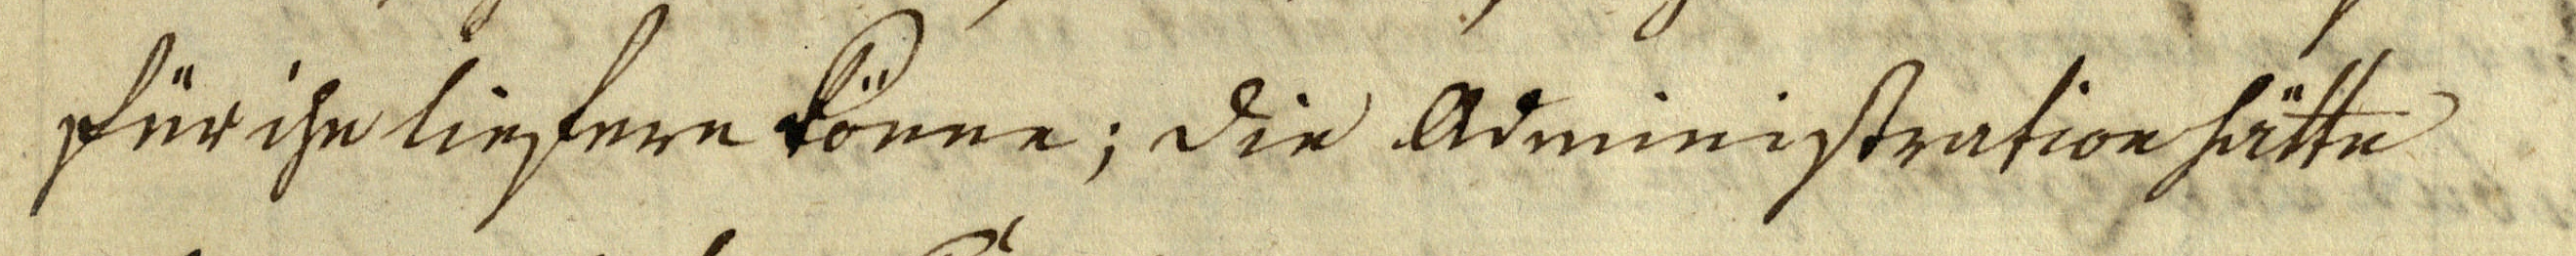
für ihn liefern könne; die Administration hätte
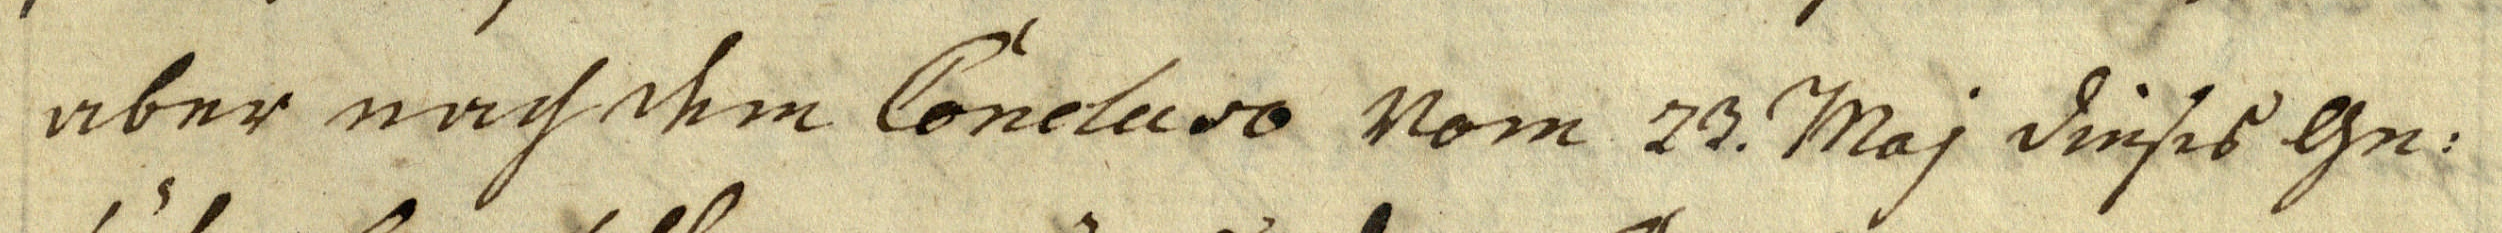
aber nach dem Concluso vom 23. Maj dieses Ge¬
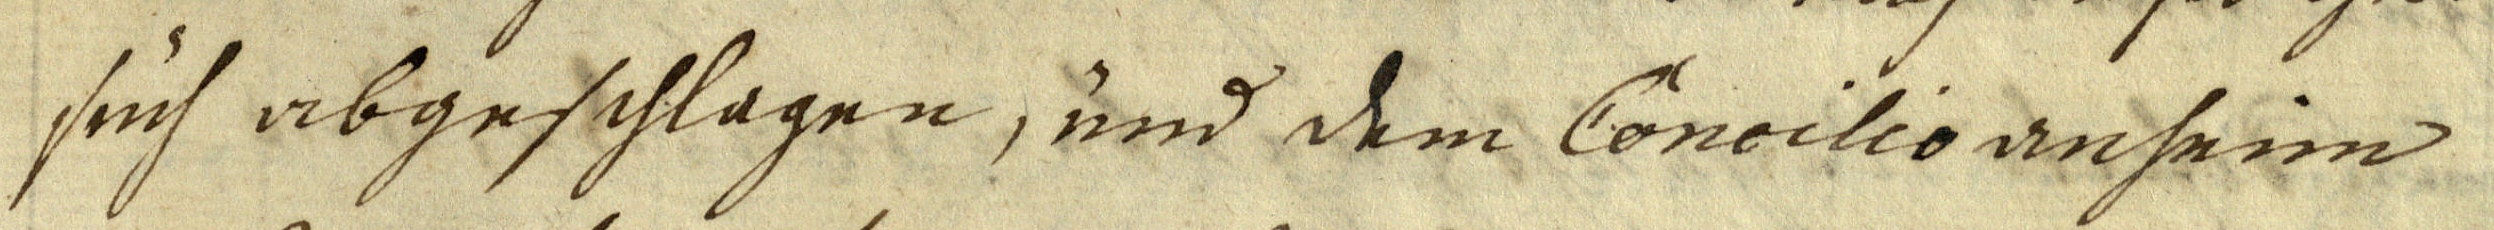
such abgeschlagen, und dem Concilio anheim
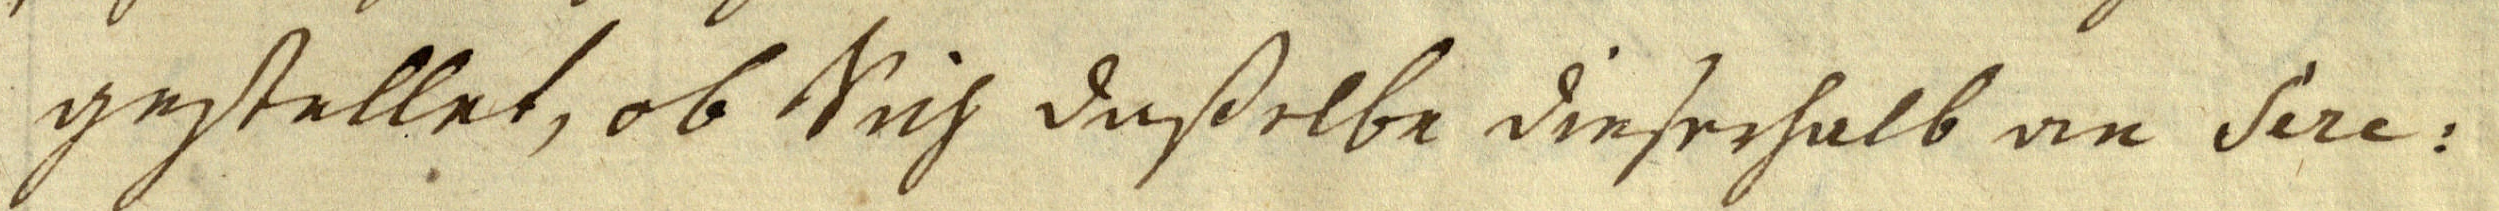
gestellet, ob Sich derselbe dieserhalb an Sere¬
